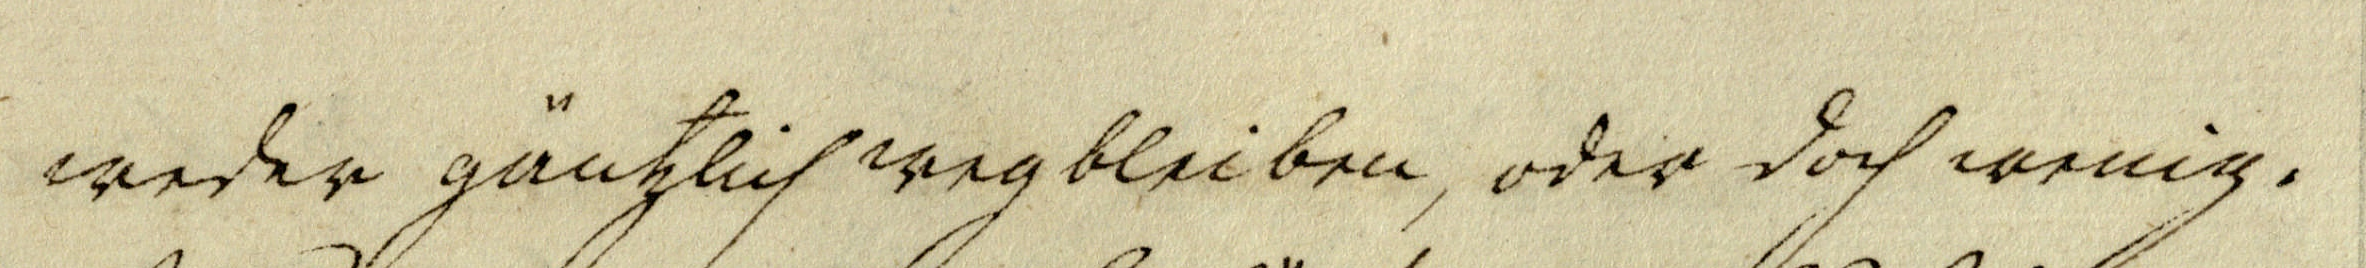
weder gäntzlich weg bleiben, oder doch wenig¬
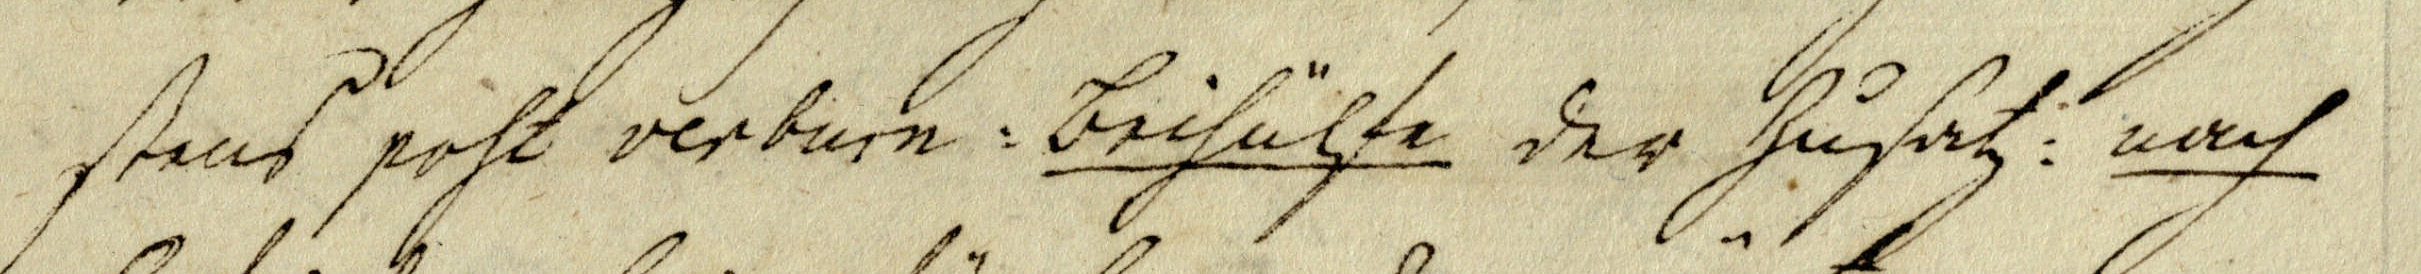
stens post verbum: Beihülfe der Zusatz: nach
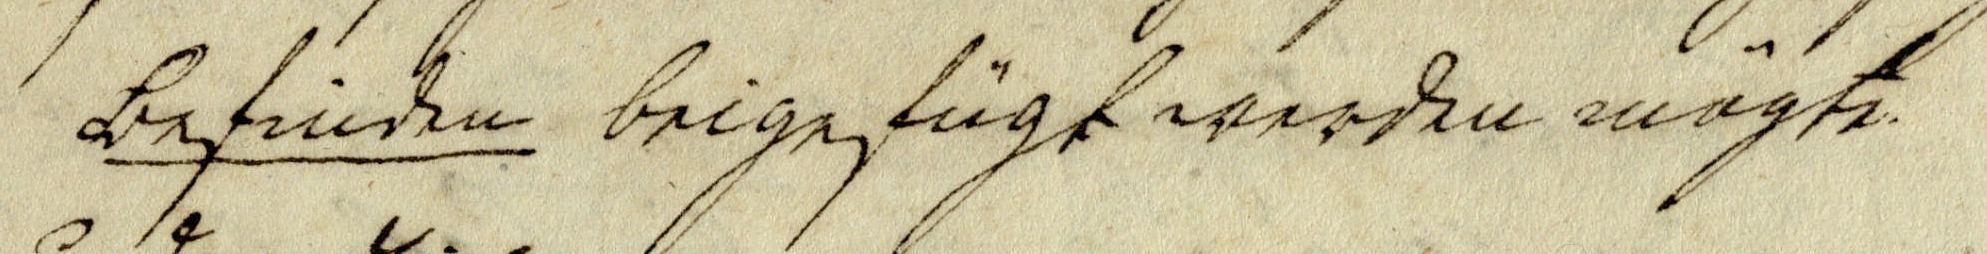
Befinden beigefügt werden mögte.
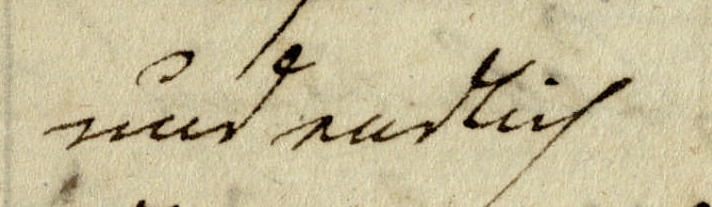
und endlich
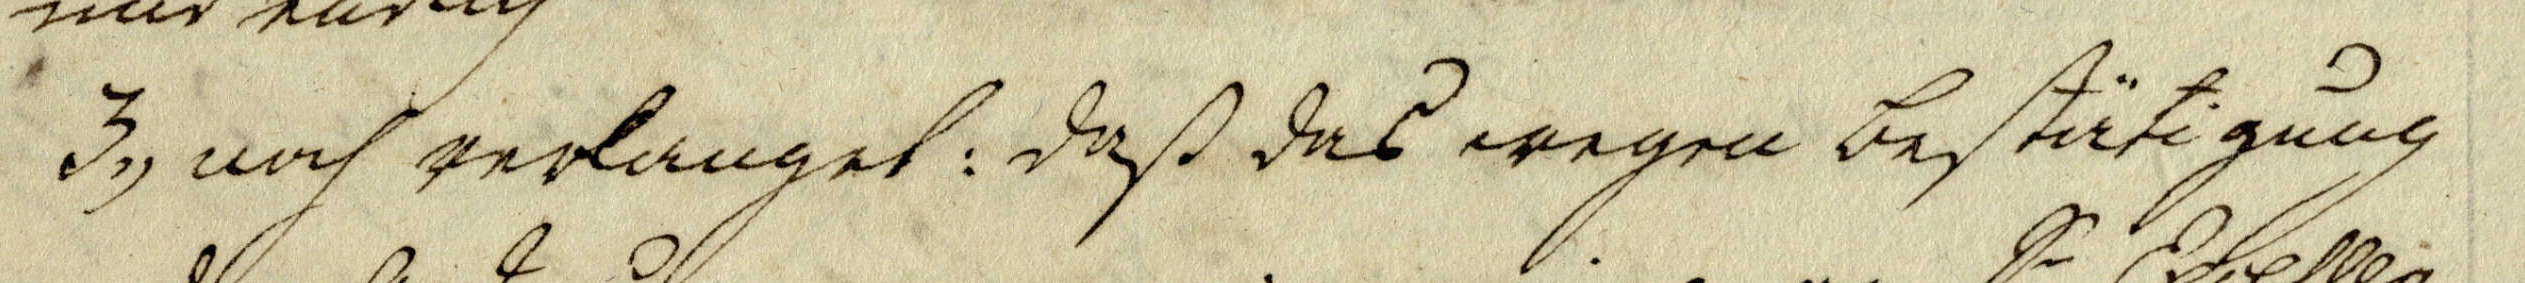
3., noch verlanget: daß das wegen Bestätigung
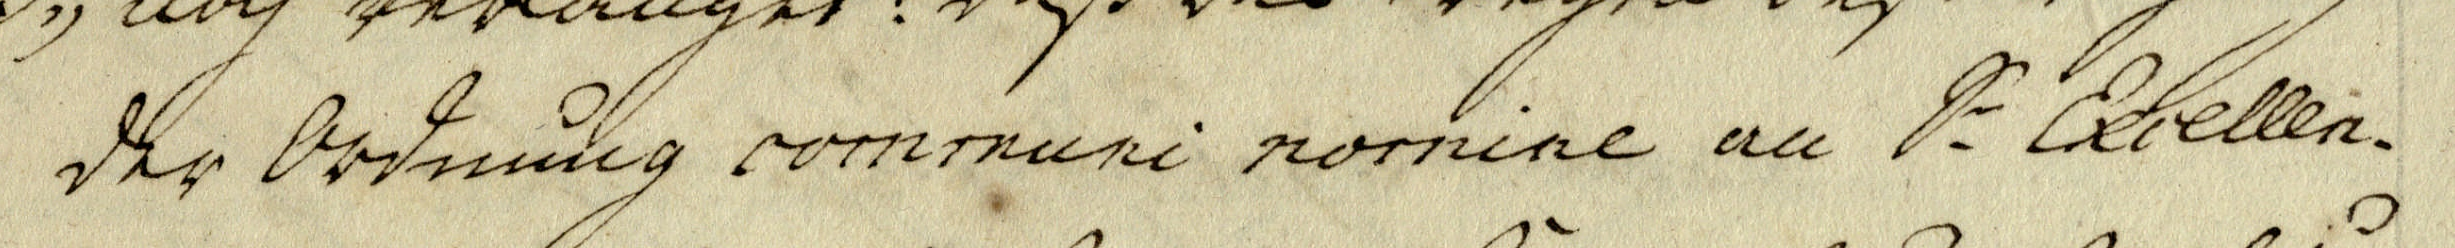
der Ordnung communi nomine an Sr Excellen¬
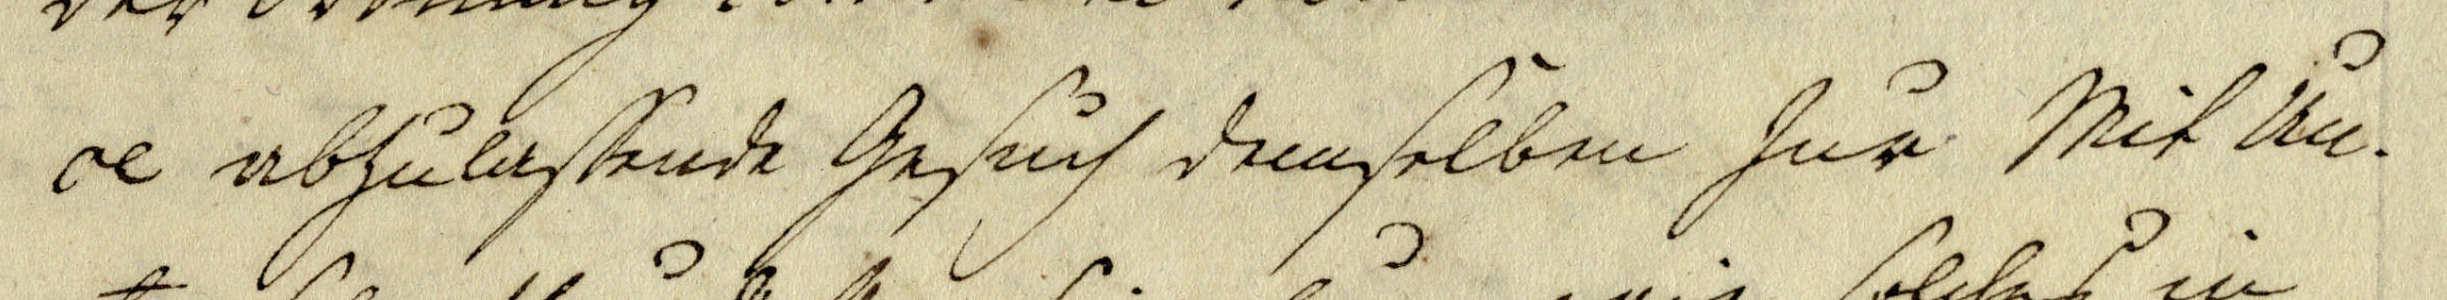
ce abzulassende Gesuch demselben zur Mit Un
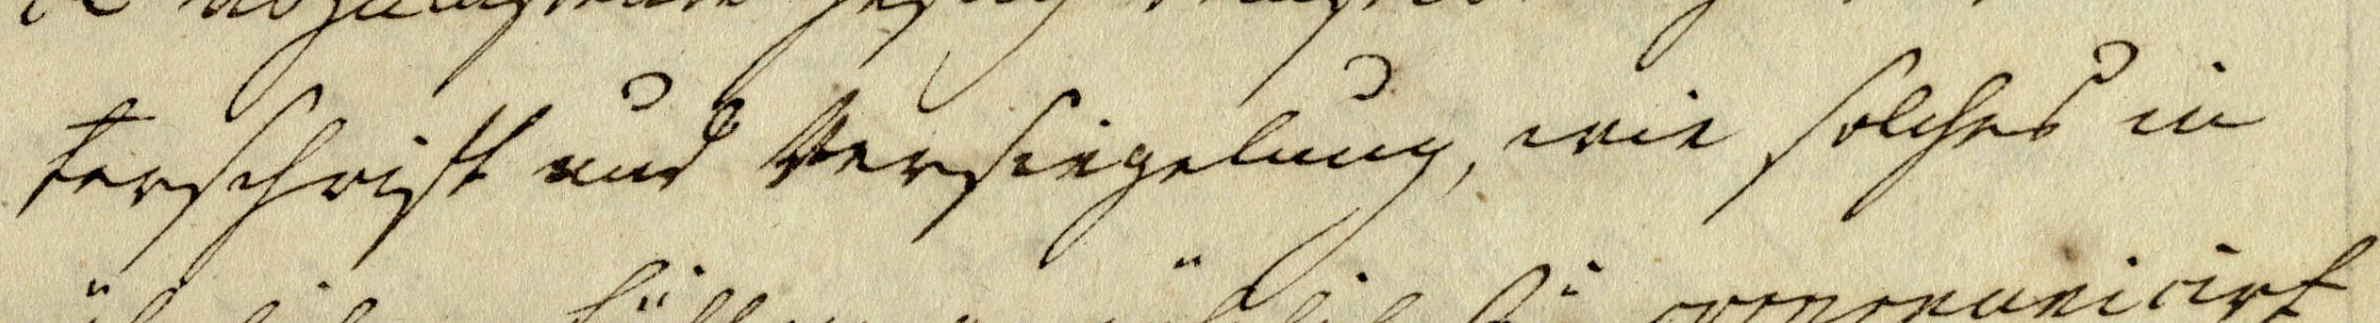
terschrift und Versiegelung, wie solches in
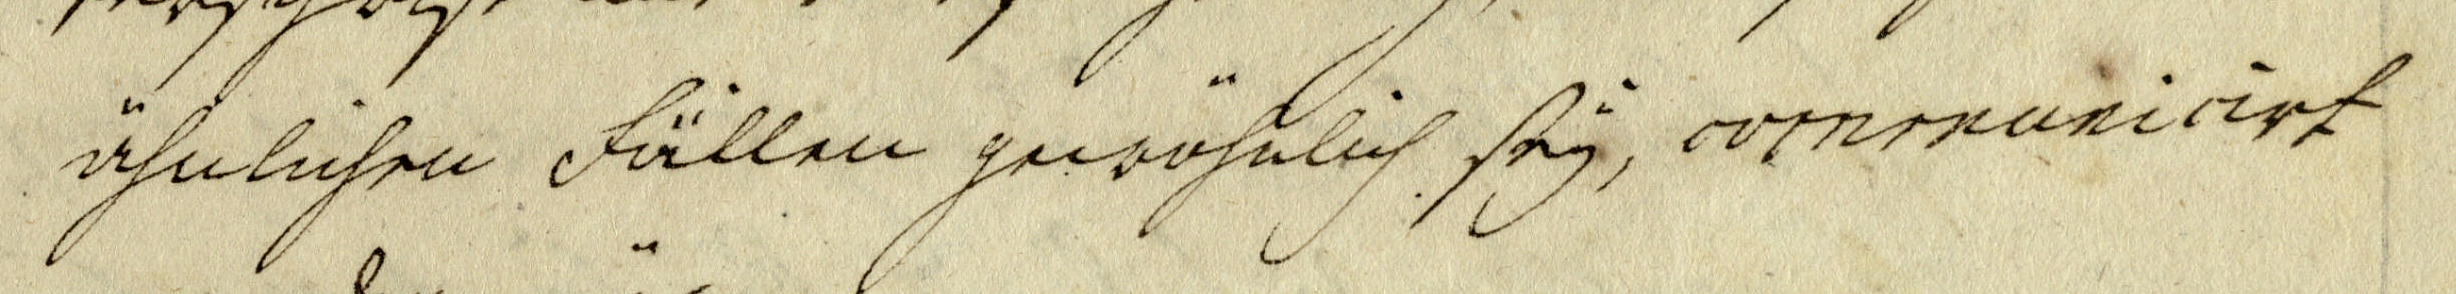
ähnlichen Fällen gewöhnlich seÿ, communicirt
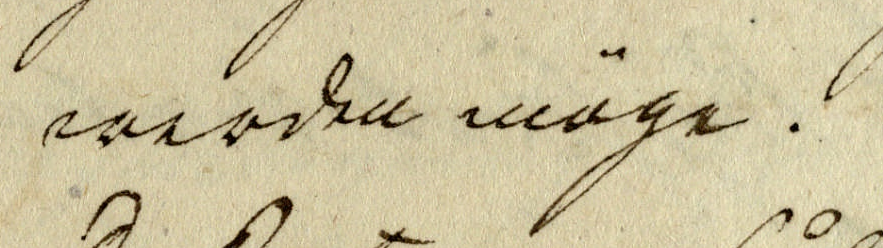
werden möge.
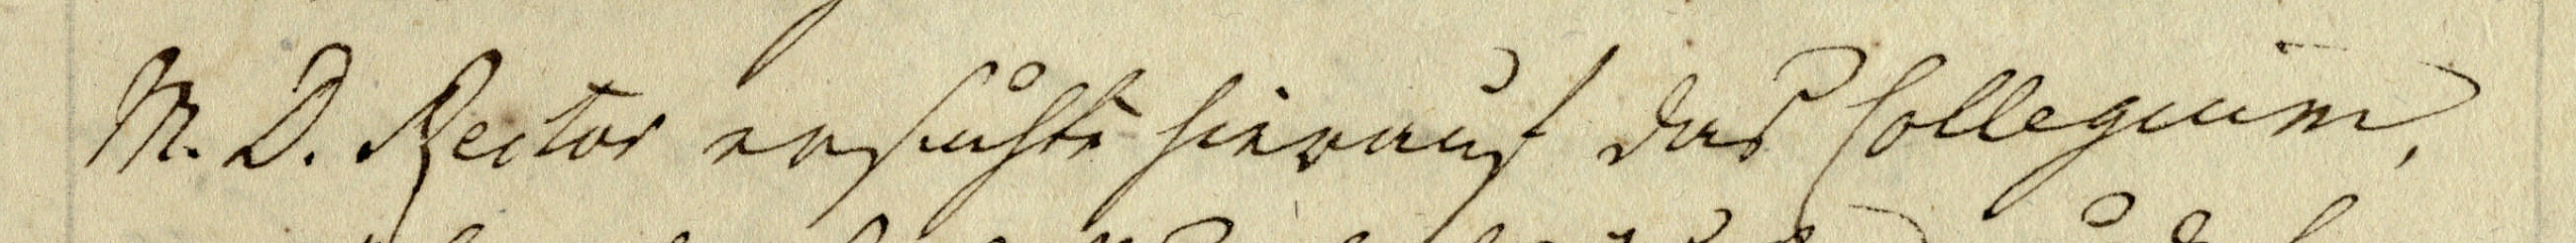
M. D. Rector ersuchte hierauf das Collegium,
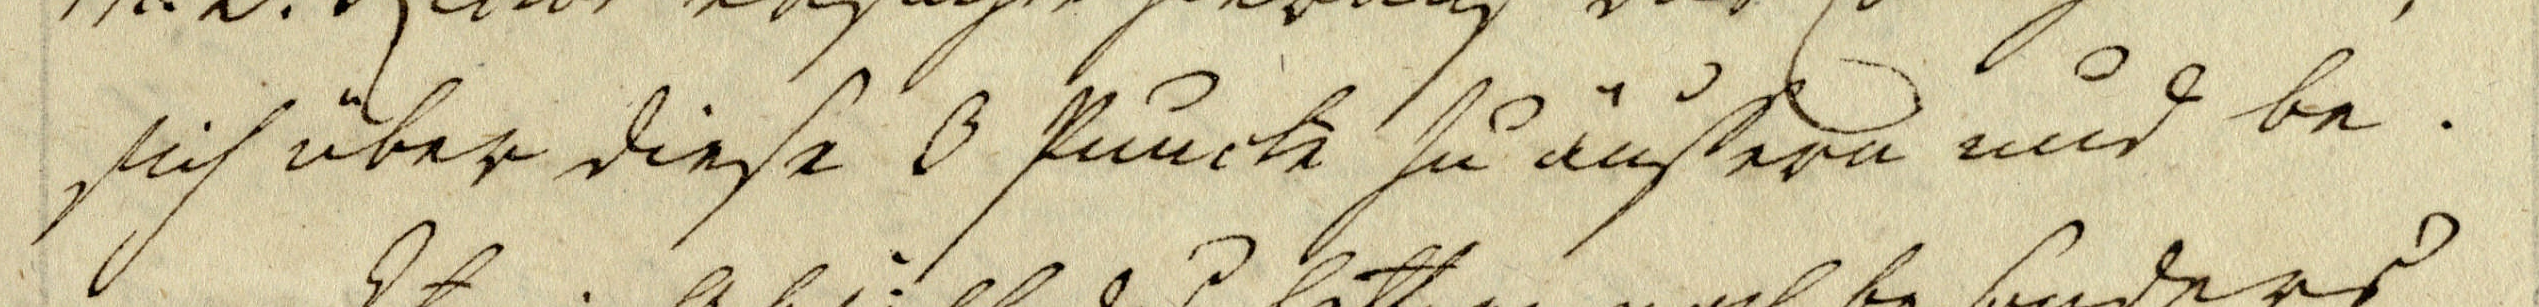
sich über diese 3 Puncte zu äussern und be¬
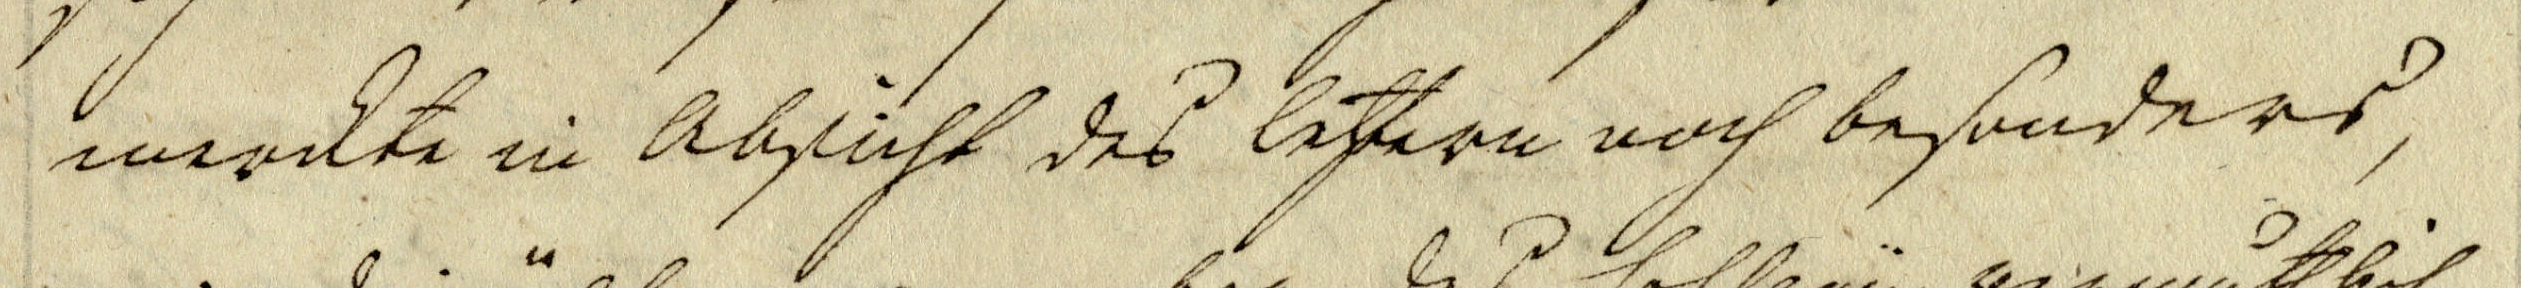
merckte in Absicht des letztern noch besonders,
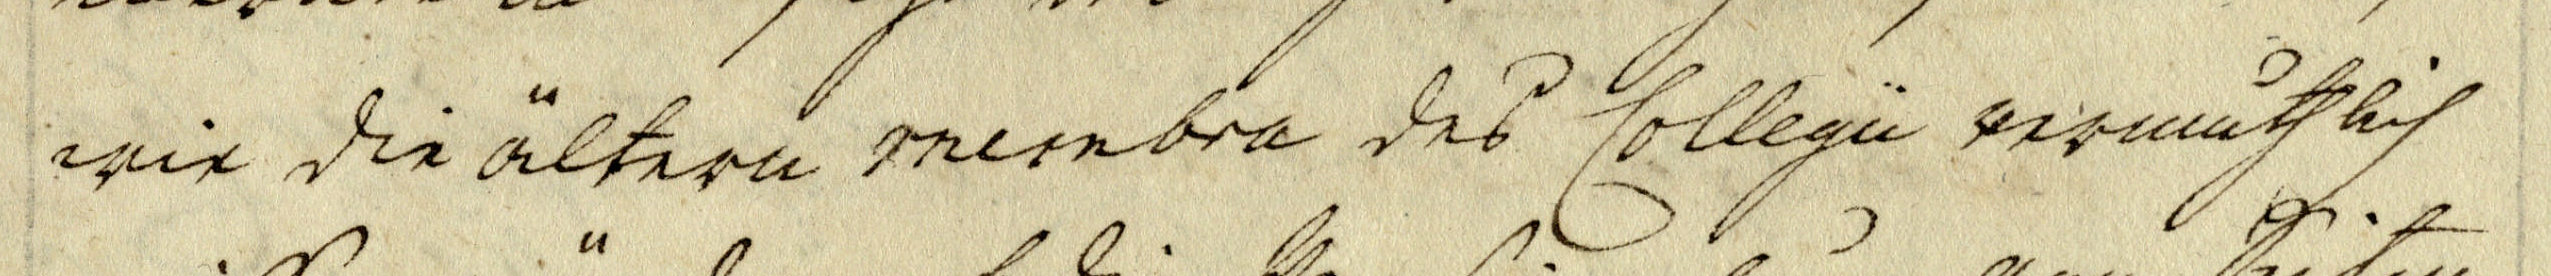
wie die ältern membra des Collegii vermuthlich
